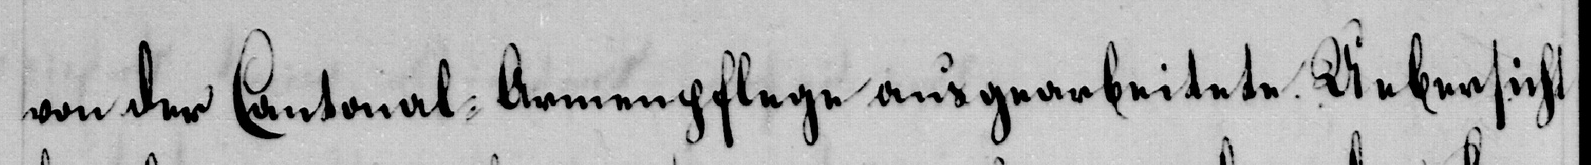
von der Cantonal-Armenpflege ausgearbeitete Uebersicht
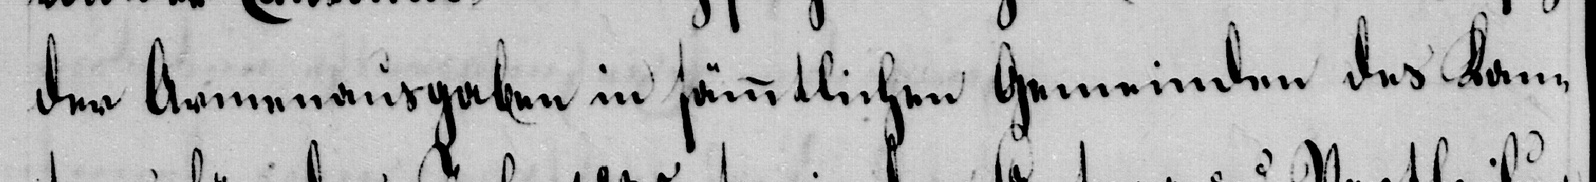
der Armenausgaben in sämmtlichen Gemeinden des Kan¬
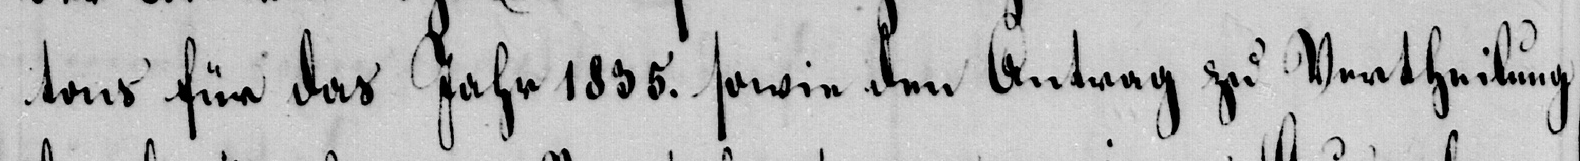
tons für das Jahr 1835. sowie den Antrag zu Vertheilung
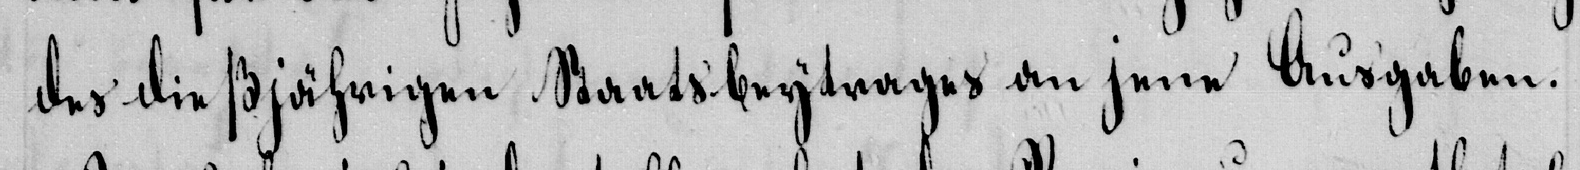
des dießjährigen Staatsbeytrages an jene Ausgaben.
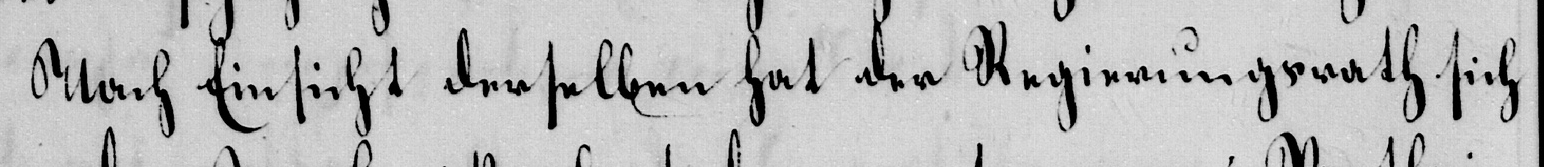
Nach Einsicht derselben hat der Regierungsrath sich
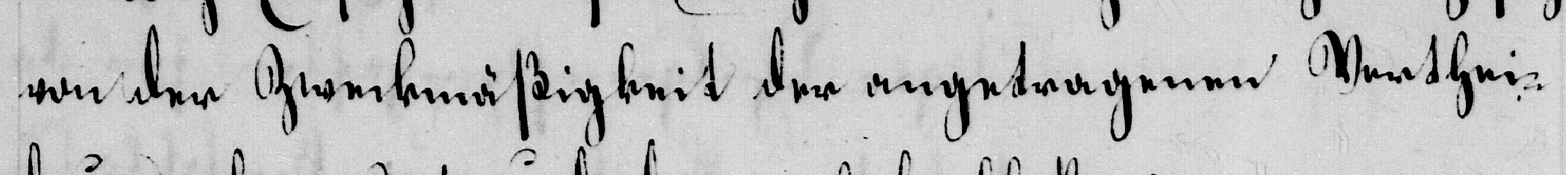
von der Zweckmäßigkeit der angetragenen Verthei¬
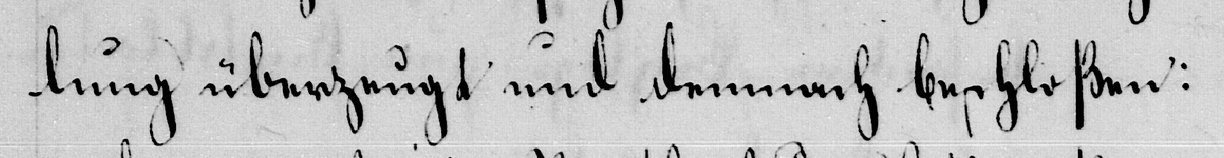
lung überzeugt und demnach beschloßen:
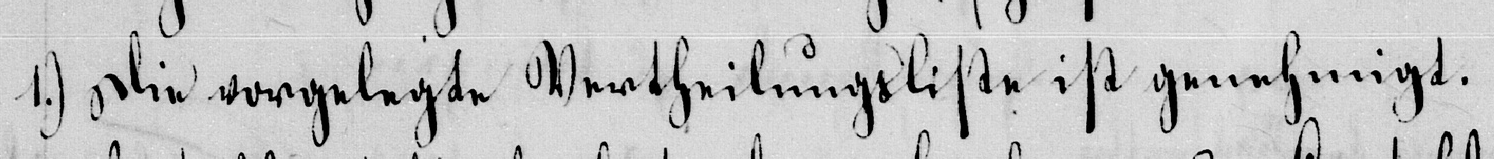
1.) Die vorgelegte Vertheilungsliste ist genehmigt.
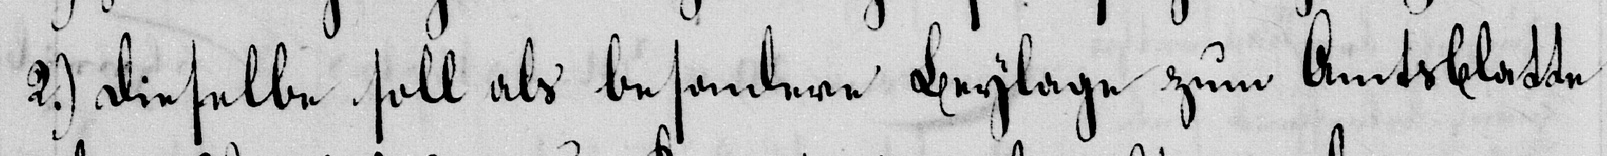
2.) Dieselbe soll als besondere Beylage zum Amtsblatte
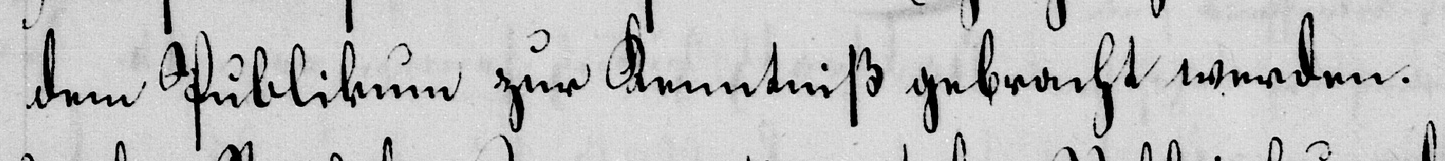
dem Publikum zur Kenntniß gebracht werden.
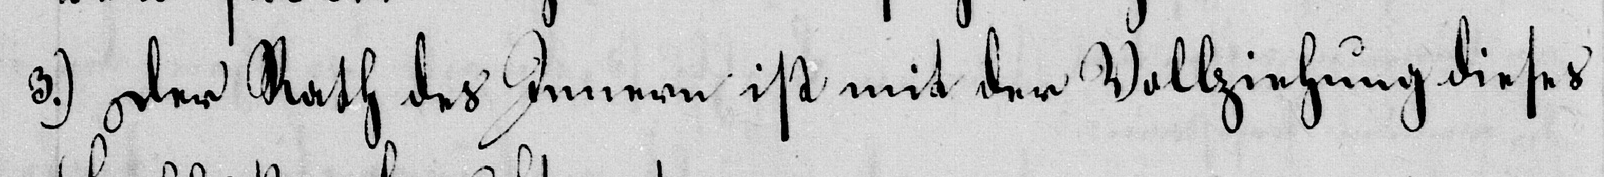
3.) Der Rath des Innern ist mit der Vollziehung dieses
